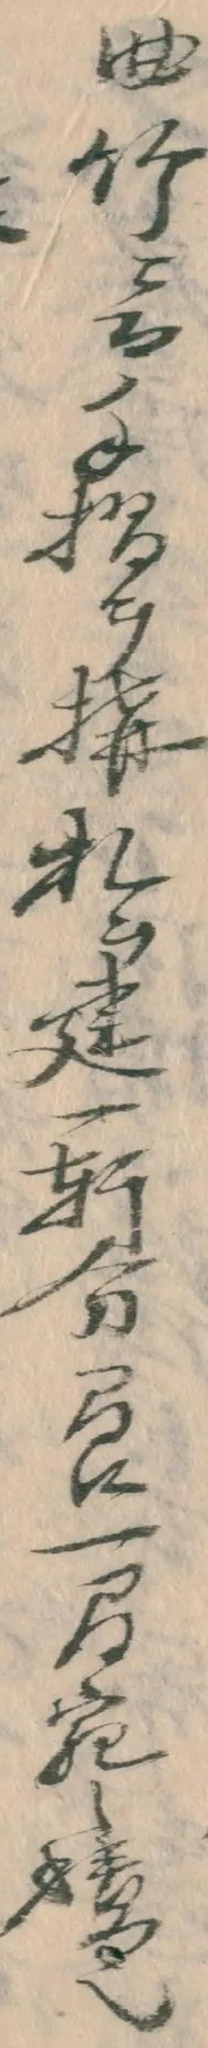曲竹ニ而手摺ヲ構札ヲ建一軒分間口一間宛之積リ也
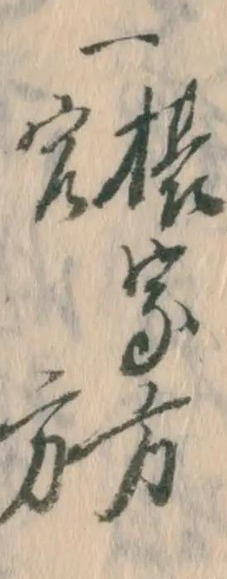一摂家方
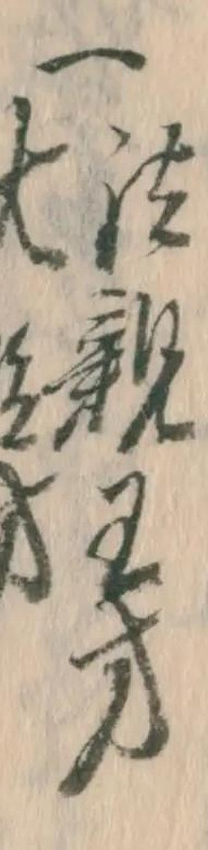一法親王方
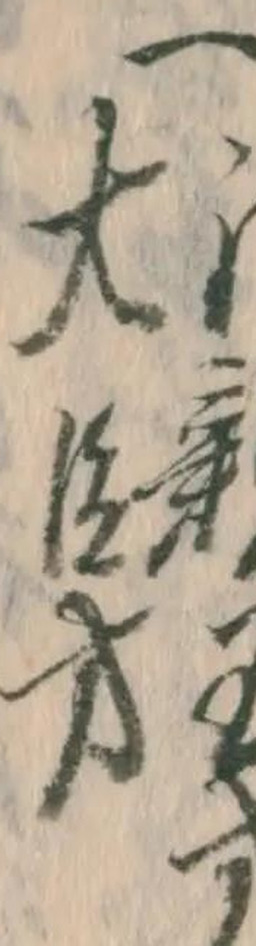大臣方
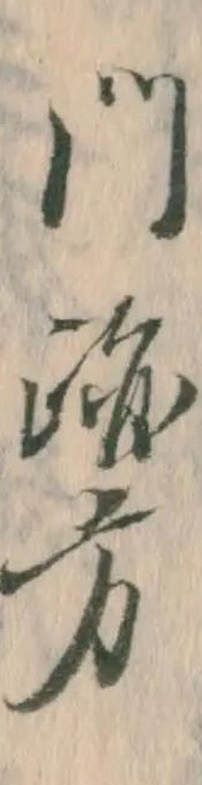門跡方
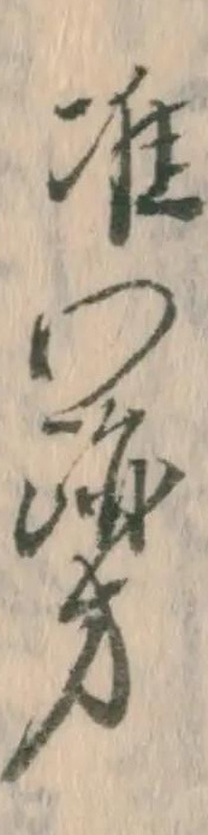准門跡方
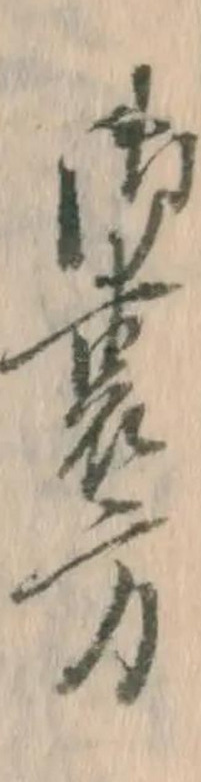御裏方
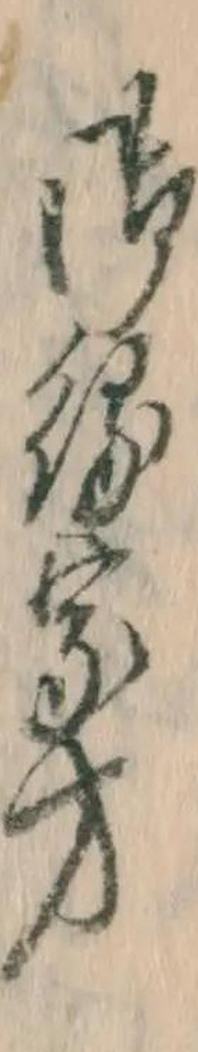御縁家方
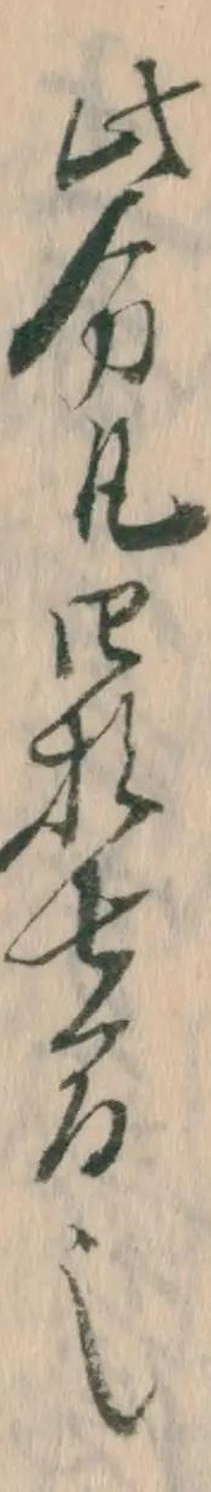此分凡四拾七間也
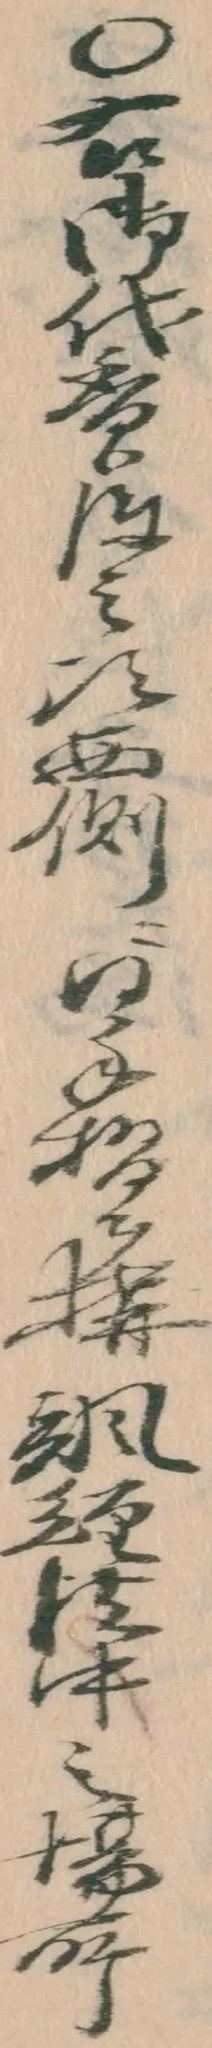○右御代番御役之頭西側ニ同手摺ヲ構諷経法中之場所
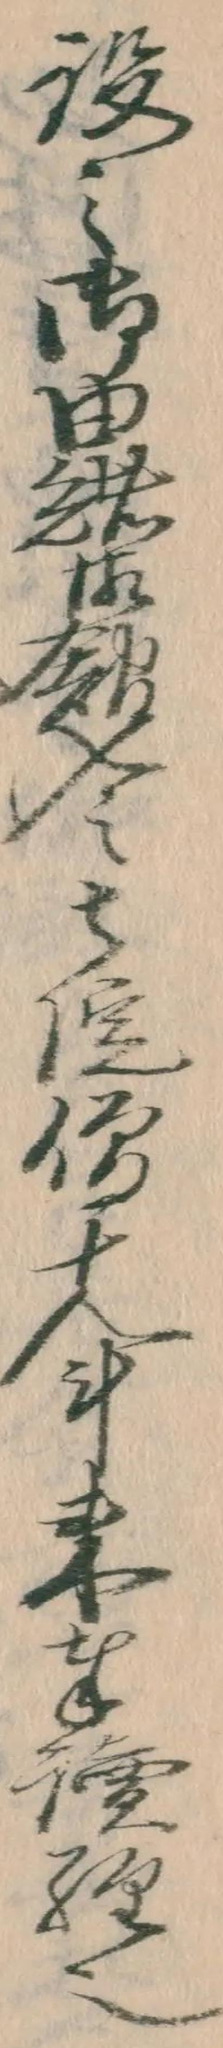設之御由緒御館入之寺院僧十八斗奉讀経也
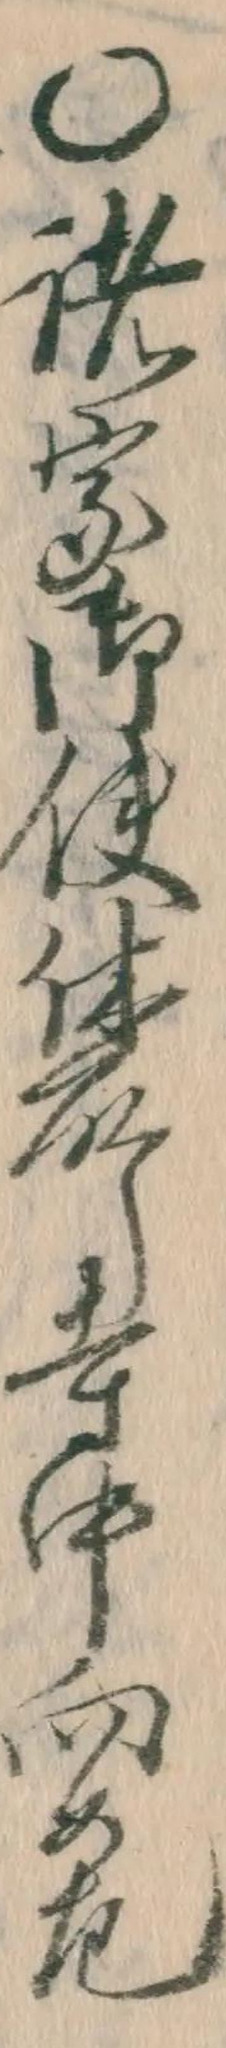◯諸家御使休所寺中向如左
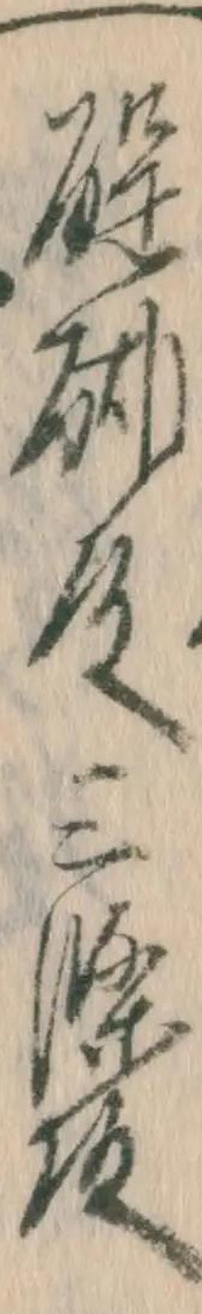醍醐殿三條殿
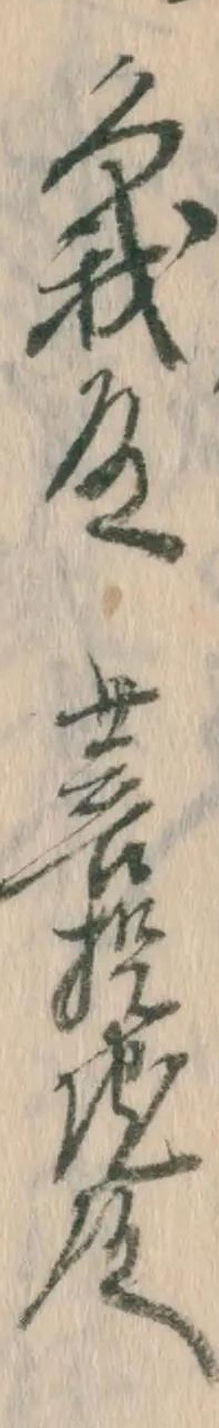久我殿菩提院殿
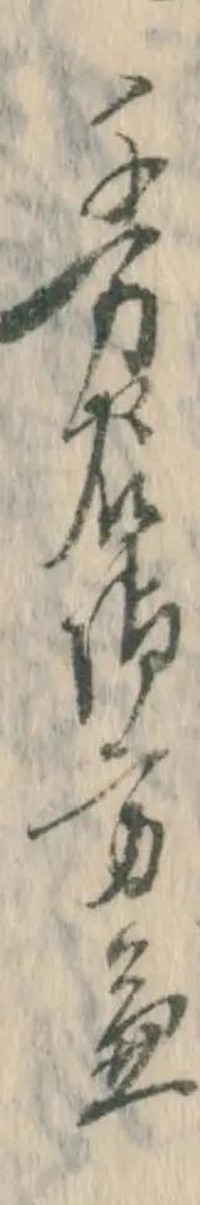千万右御方兼

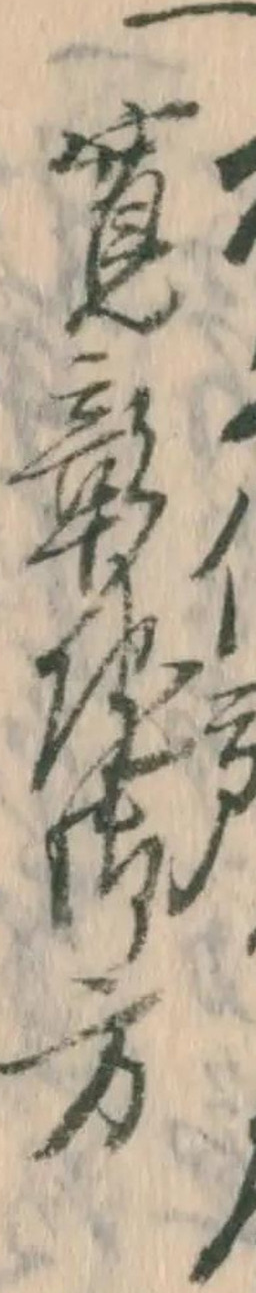寛彰院御方
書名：賀茂社記録. 第67冊
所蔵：国立国会図書館 National Diet Library, JAPAN
